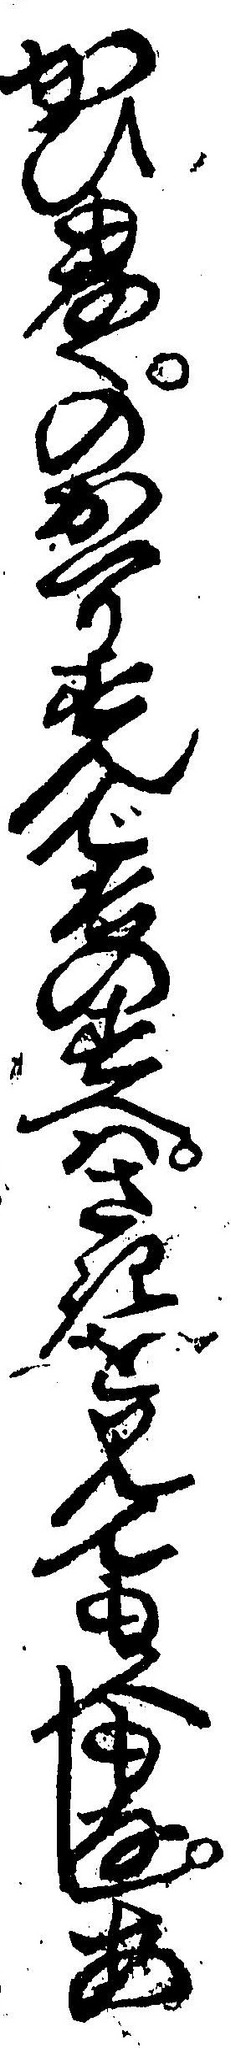かひまなく。のおくりすんでそのすへは。さきを見ても人もなし。あ
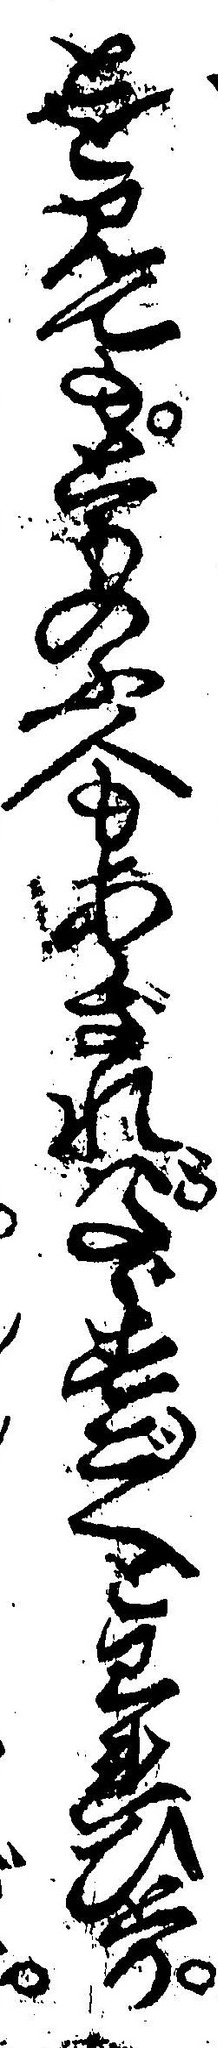とを見ても。とものふ人もあらざれば。たゞすご〳〵とわれひとり。
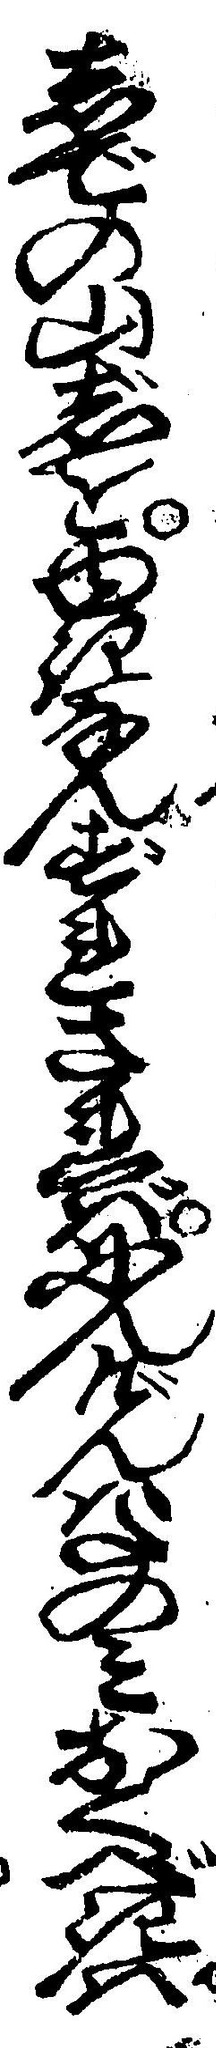しでの山じを。ゆきなんずれされば。にんげんはたのみおくべきは。
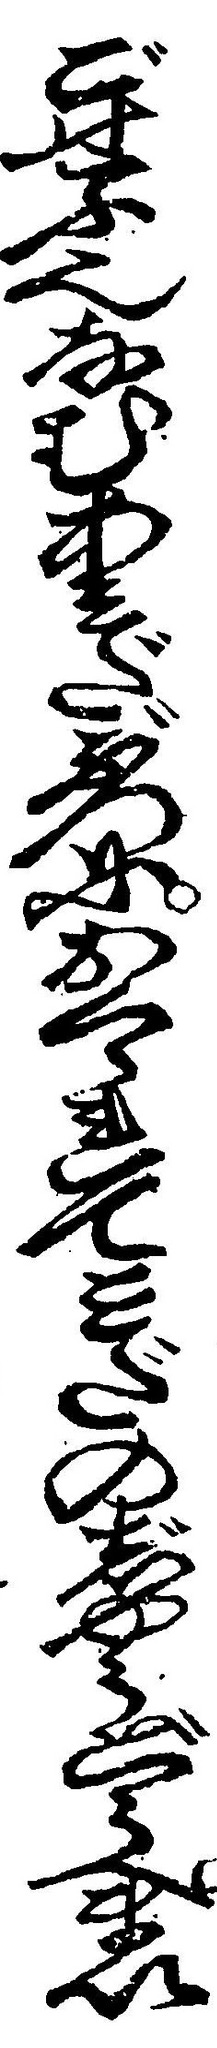ごせふ也なむあみだぶつに。おくられてみだのじやうどうへ。まい
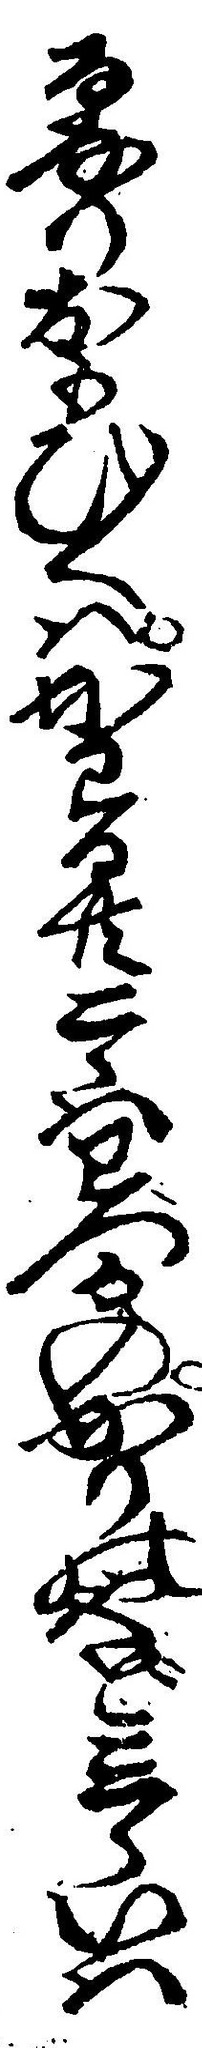るなりおもひ〳〵は。かわる共こゝはわつかの。かりのやどみらいは
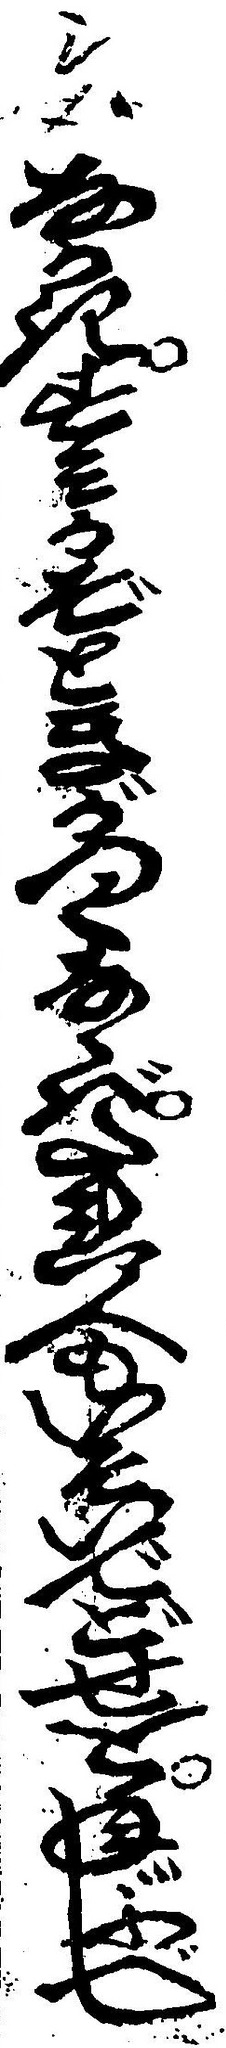なかき。すみかぞときがつくならば。たれ人もいそいでどせを。ねふべし。
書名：目連尊者地獄めくり / 宇留藤太夫正本
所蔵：東京大学総合図書館 General Library in the University of Tokyo, JAPAN
